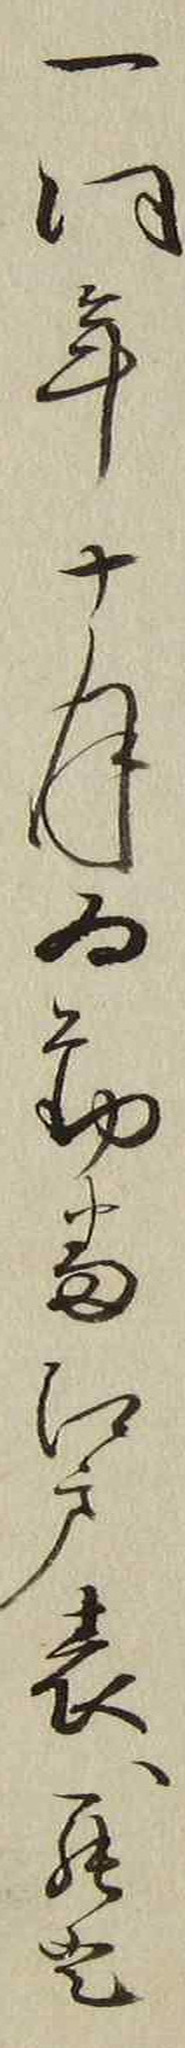一同年十月為勤番江戸表へ罷登
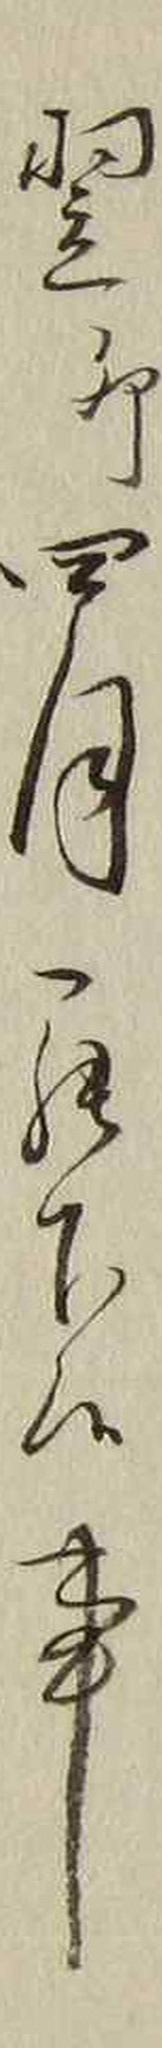翌卯四月罷下候事
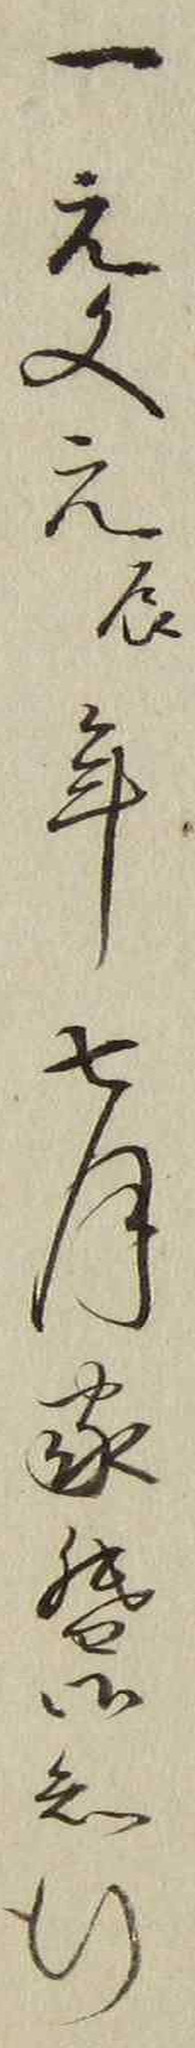一元文元辰年七月家督御知行

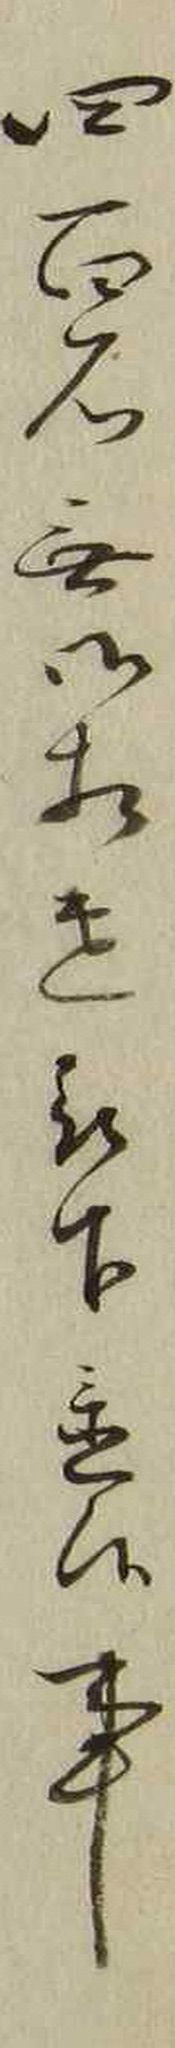四百石無御相違被下置候事
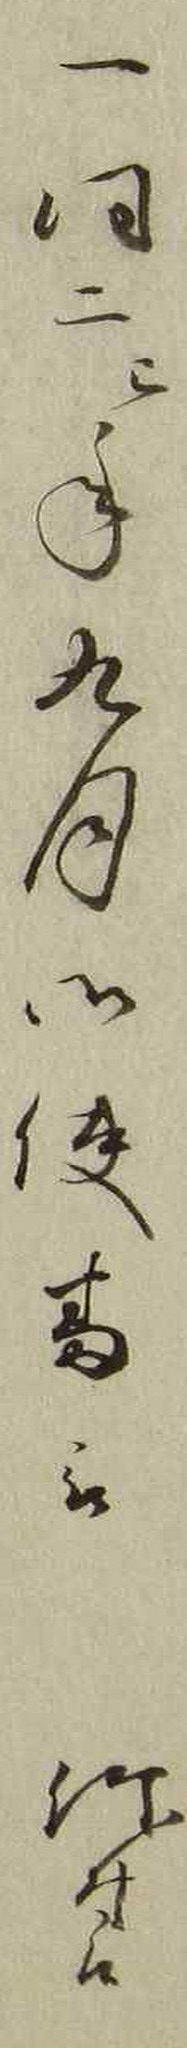一同二巳年九月御使番被仰付候
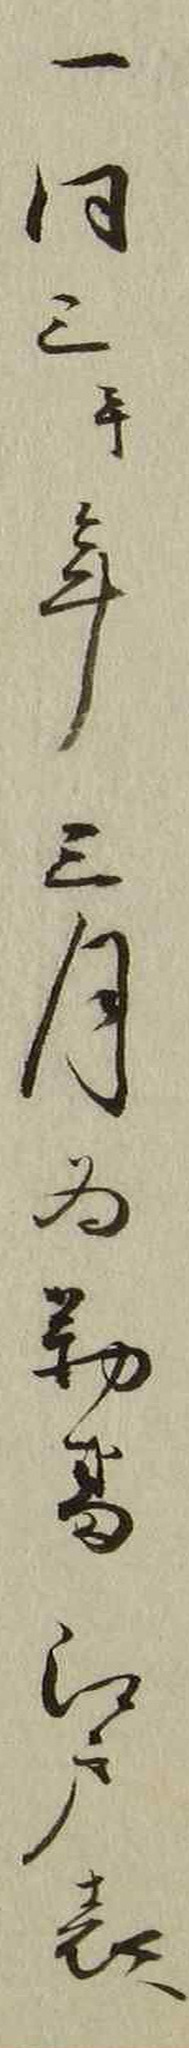一同三午年三月為勤番江戸表へ
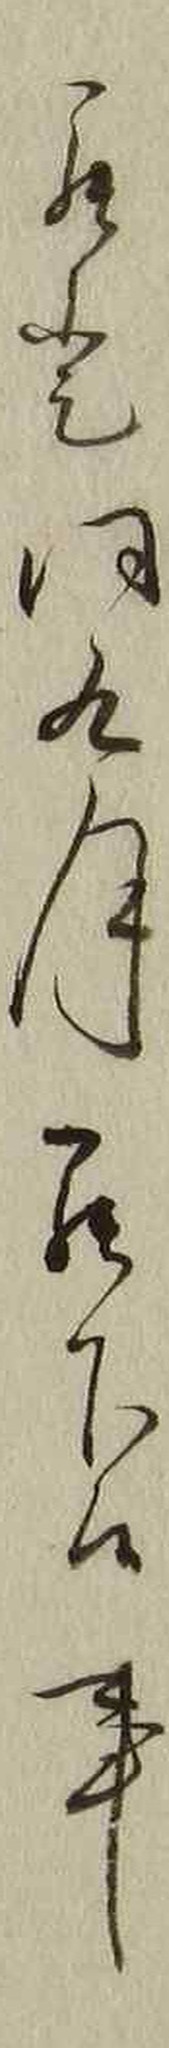罷登同九月罷下候事
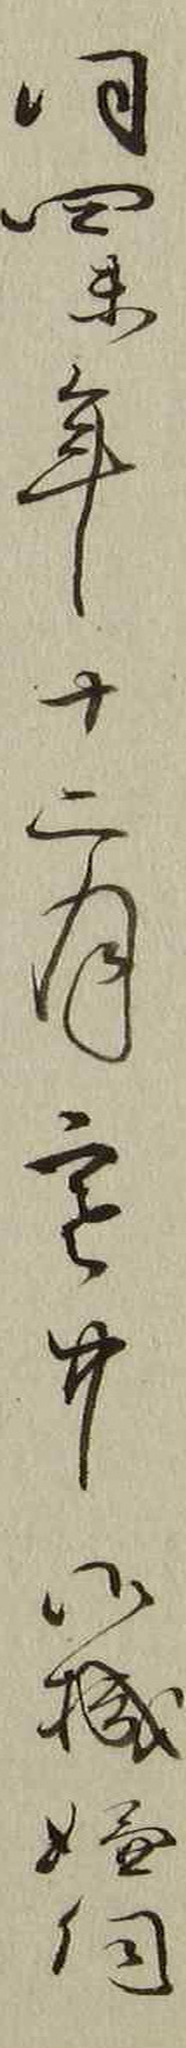同四未年十二月寒中御機嫌伺
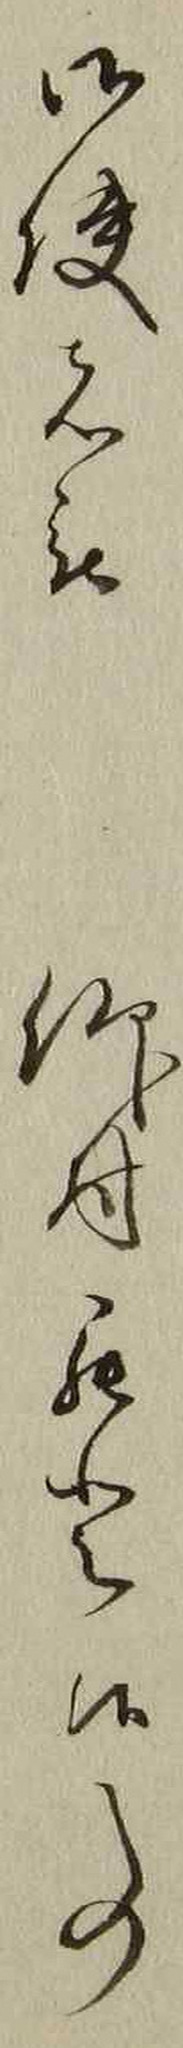御使者被仰付罷登候事
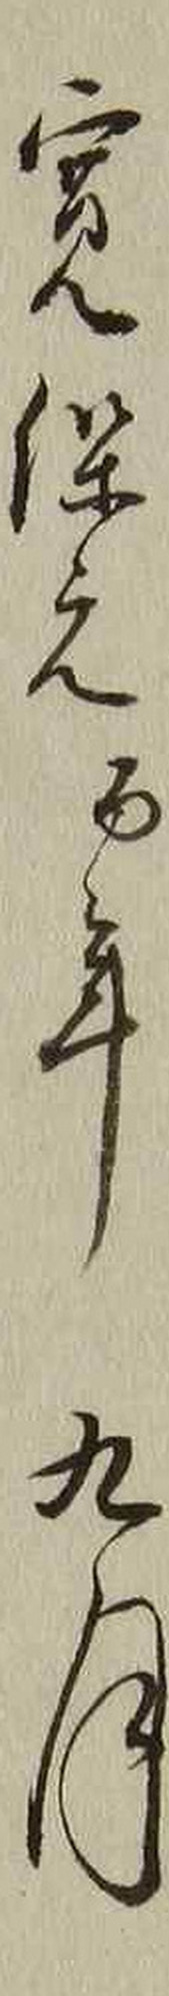寛保元酉年九月
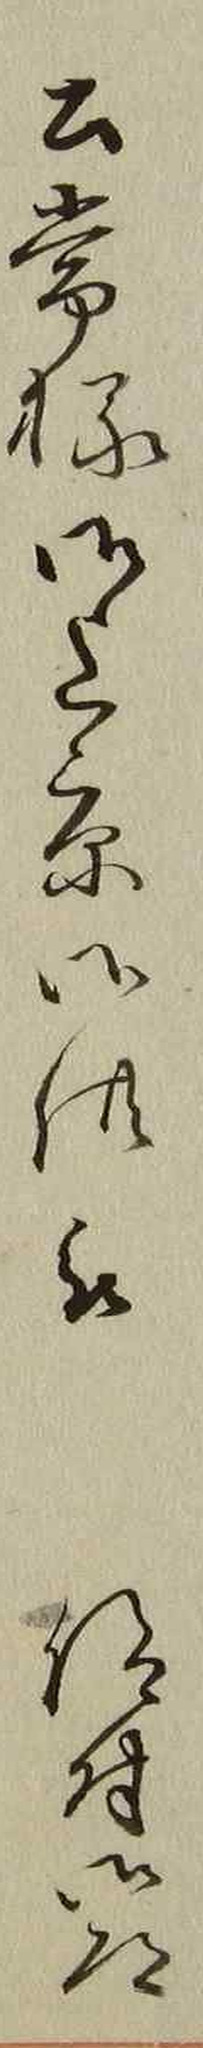土常様御上京御供被仰付御道
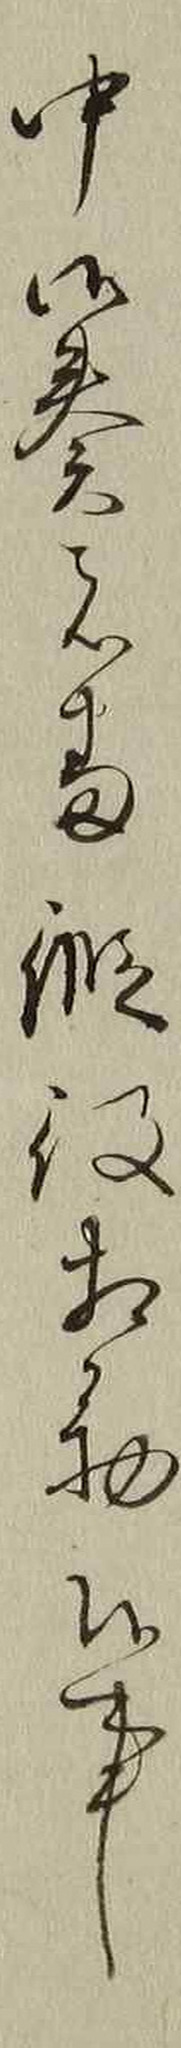中御奏者番假役相勤候事
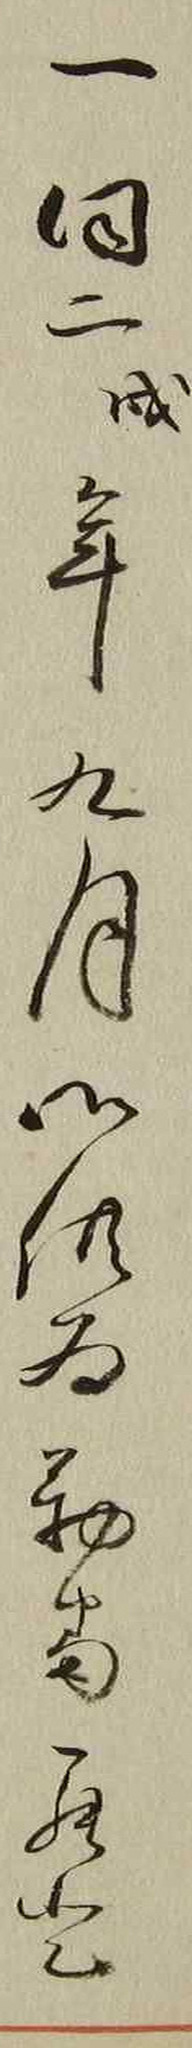一同二戌年九月御供為勤番罷登
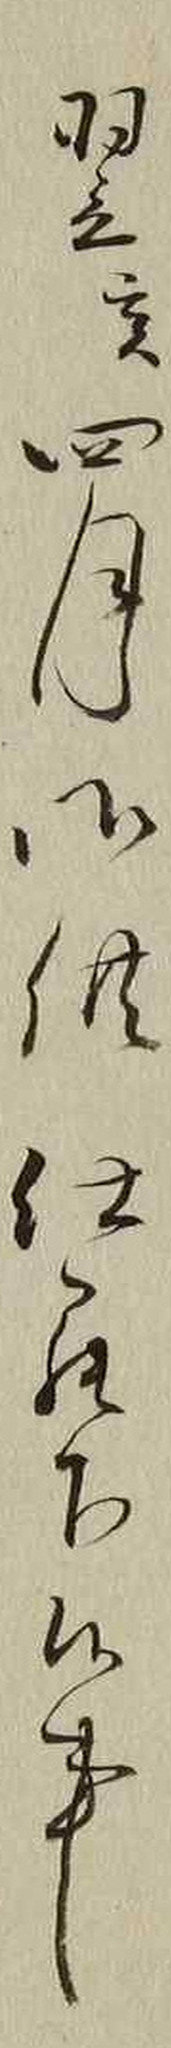翌亥四月御供仕罷下候事
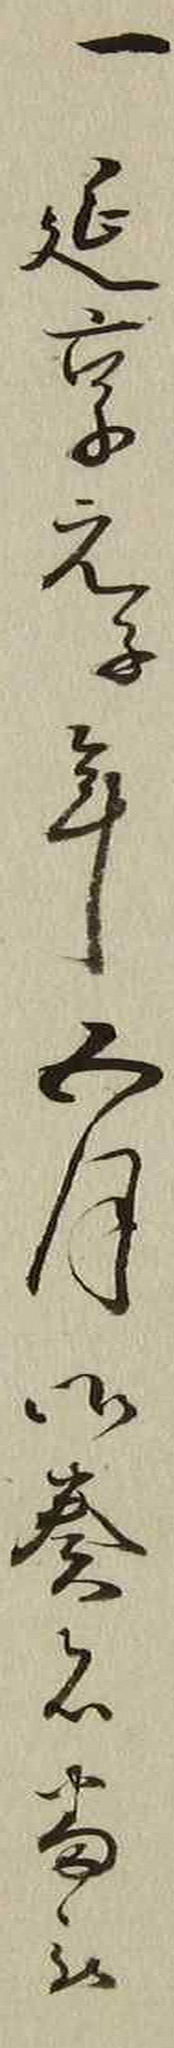一延享元子年五月御奏者番被
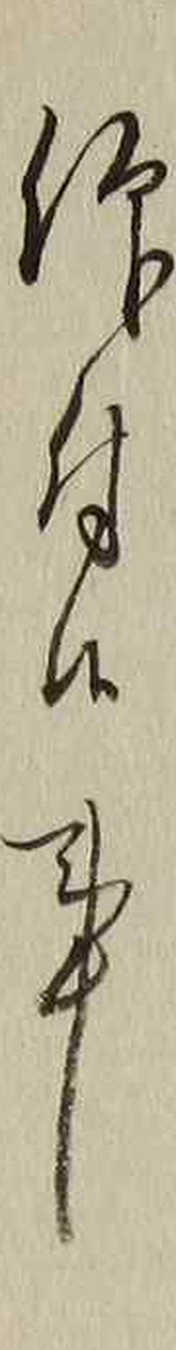仰付候事
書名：諸士系譜　巻之2　い之部2
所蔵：会津若松市立会津図書館
